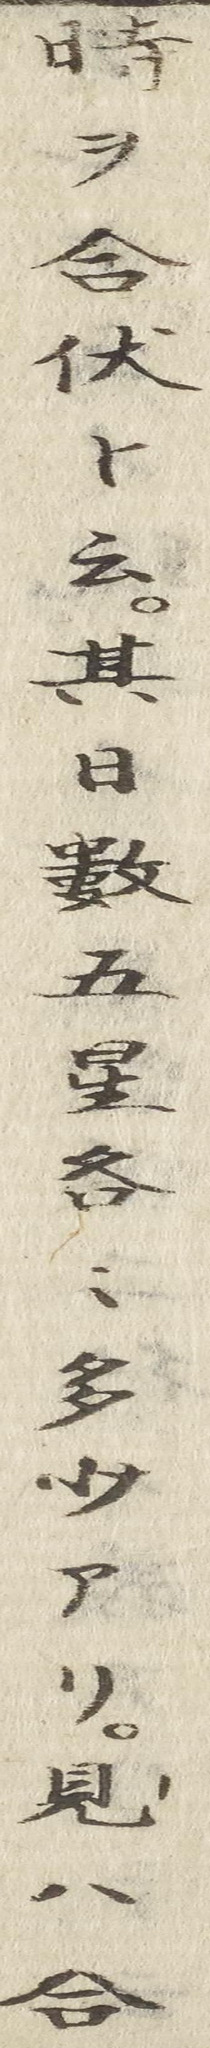時ヲ合伏ト云。其日数五星各々多少アリ。見ハ合
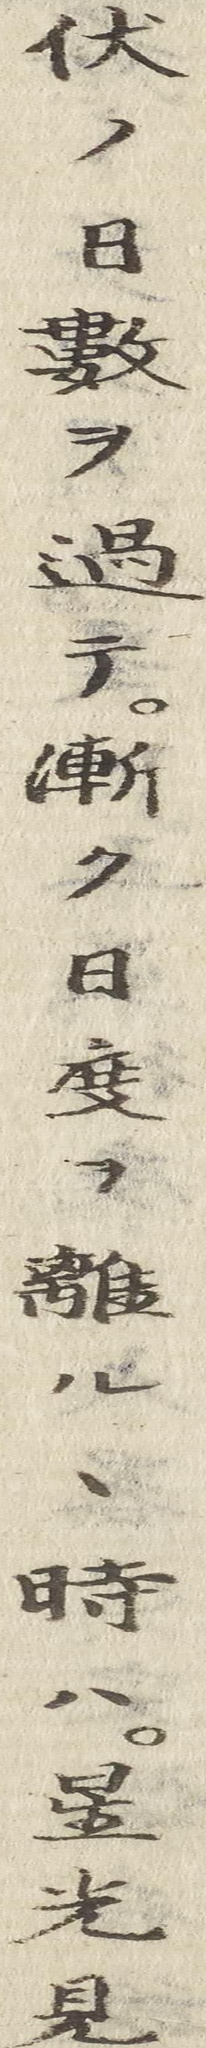伏ノ日数ヲ過テ。漸ク日度ヲ離ルヽ時ハ。星光見
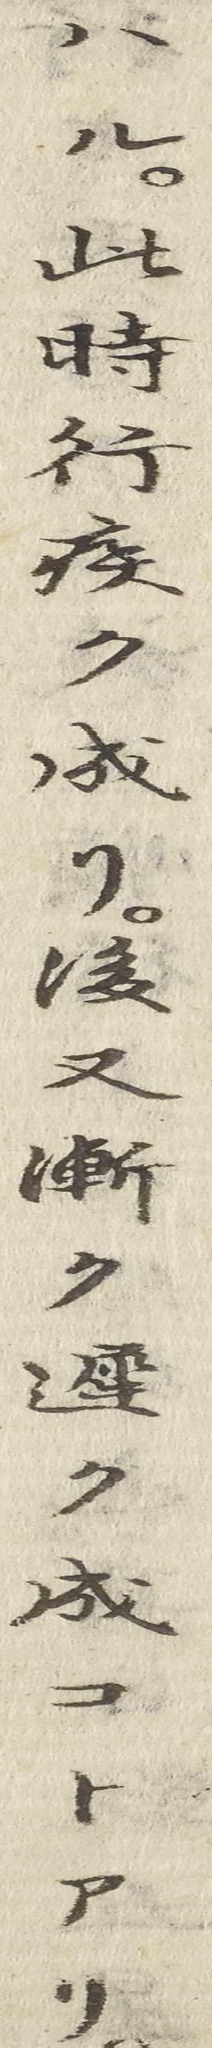ハル。此時行疾ク成リ。後又漸ク遅ク成コトアリ。
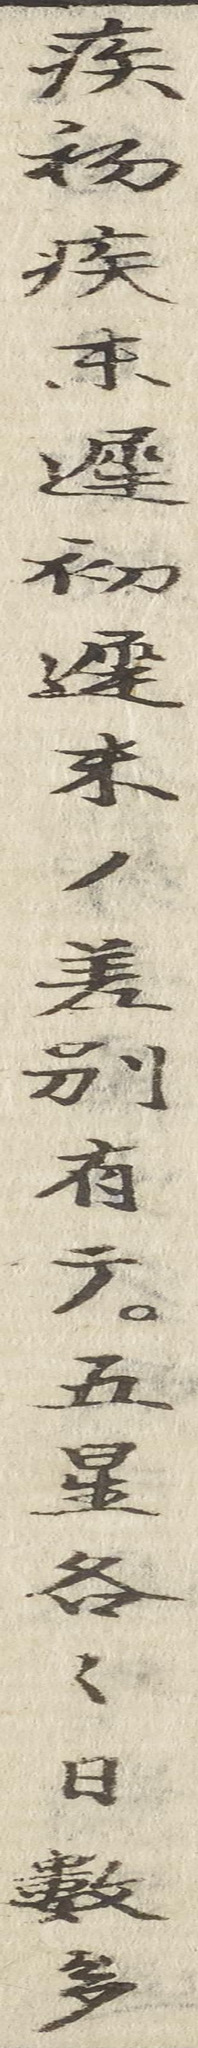疾初疾末遅初遅末ノ差別有テ。五星各々日数多
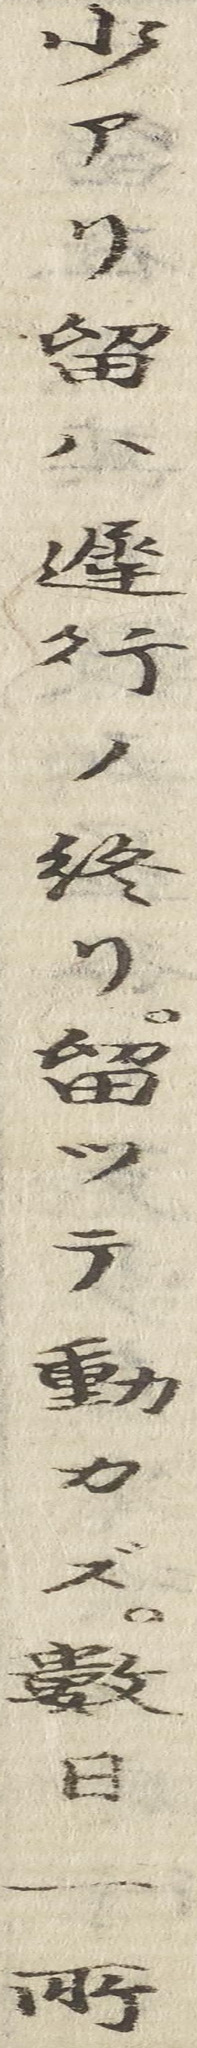少アリ留ハ遅行ノ終リ。留ツテ動カズ。数日一所

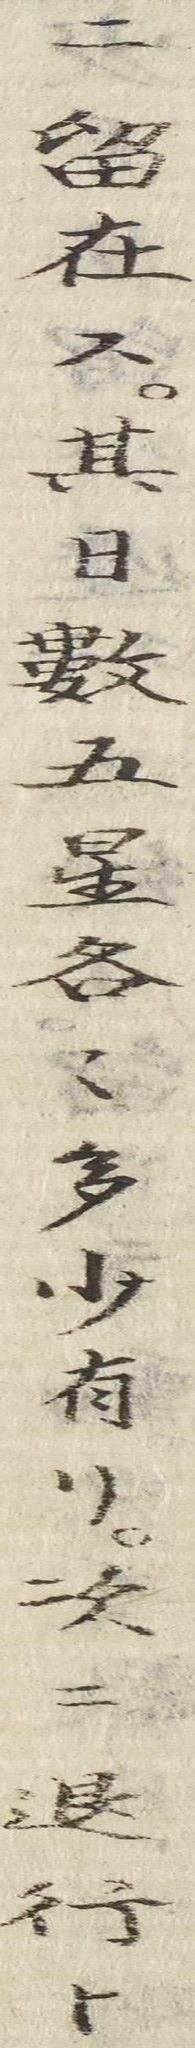ニ留在ス。其日数五星各々多少有リ。次ニ退行ト
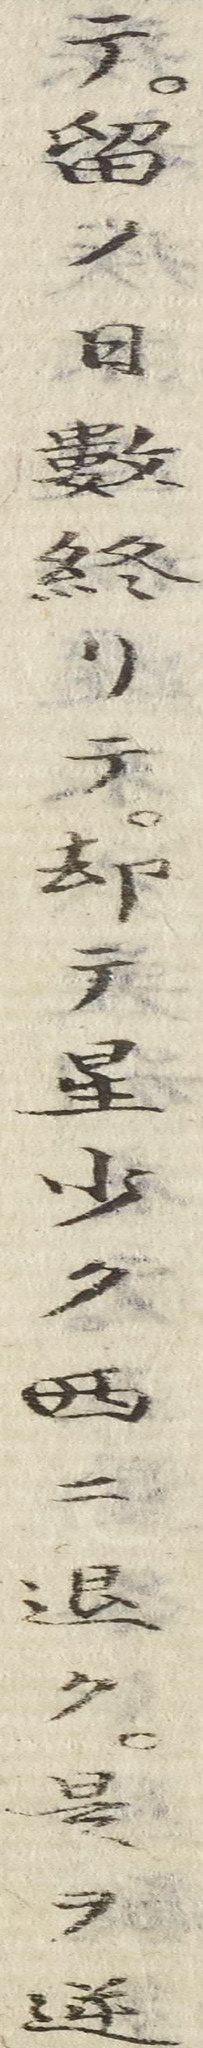テ。留ノ日数終リテ。却テ星少ク西ニ退ク。是ヲ逆
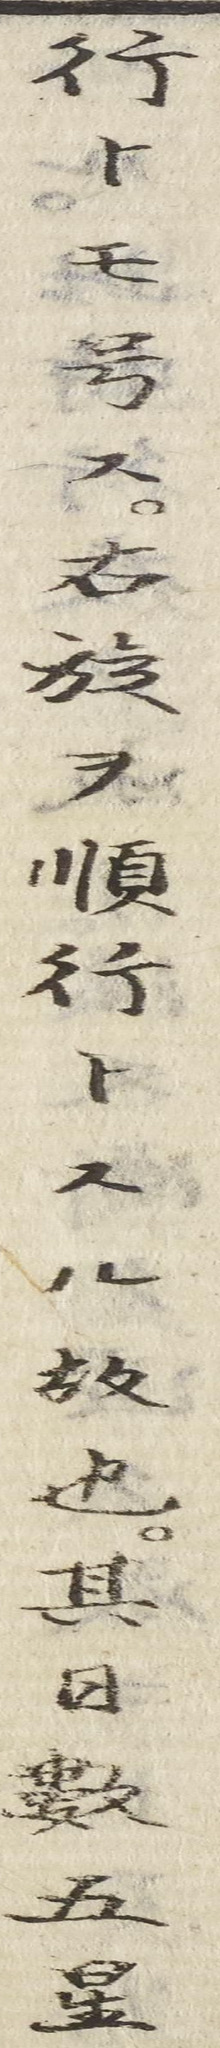行トモ号ス。右旋ヲ順行トスル故也。其日数五星
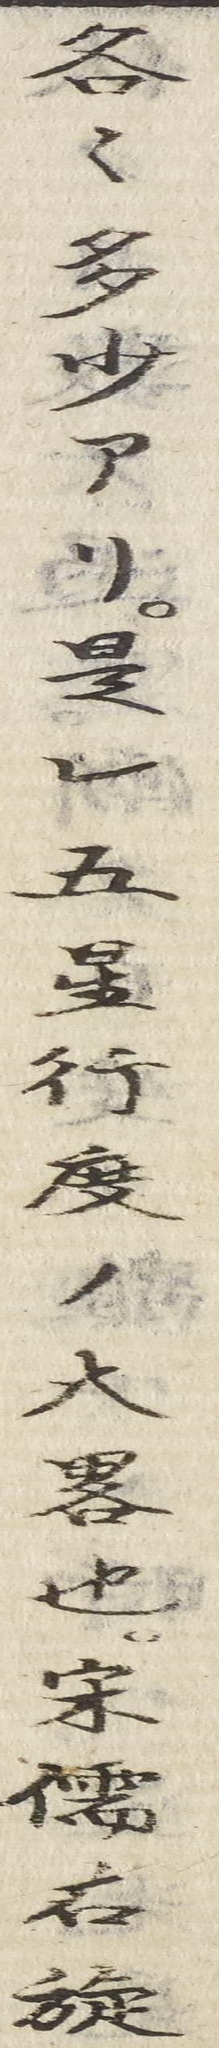各々多少アリ。是レ五星行度ノ大略也。宋儒右旋
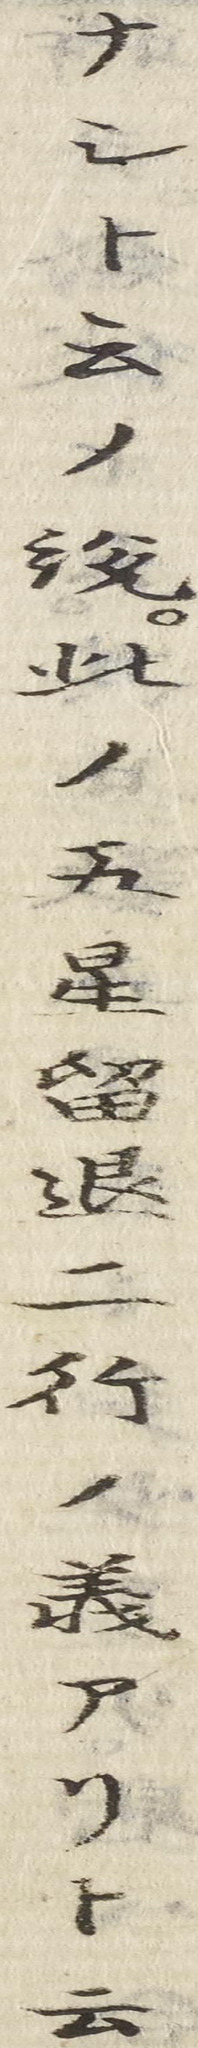ナシト云ノ説。此ノ五星留退二行ノ義アリト云
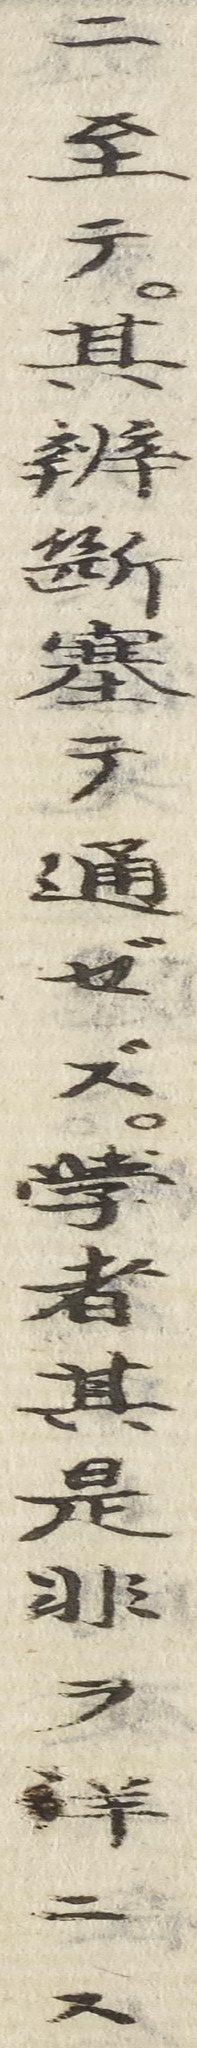ニ至テ。其弁断塞テ通ゼズ。学者其是非ヲ鮮ニス
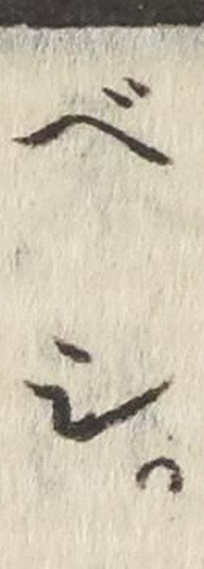ベシ。
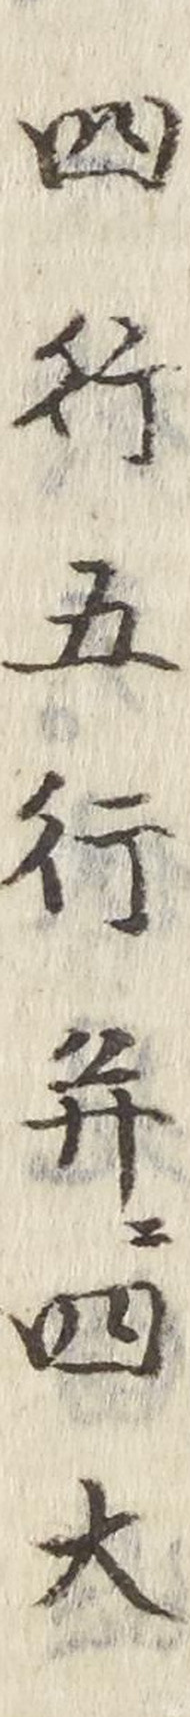四行五行并ニ四大
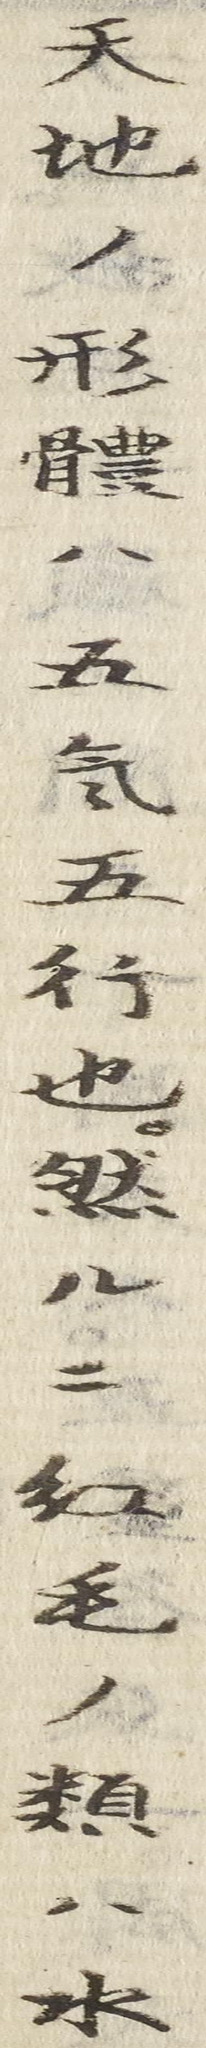天地ノ形体ハ五気五行也。然ルニ紅毛ノ類ハ水
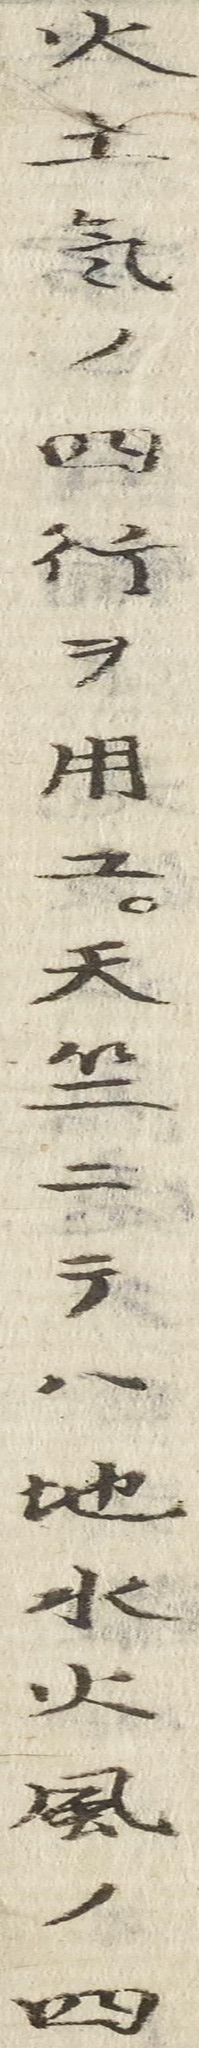火土気ノ四行ヲ用ユ。天竺ニテハ地水水火風ノ四
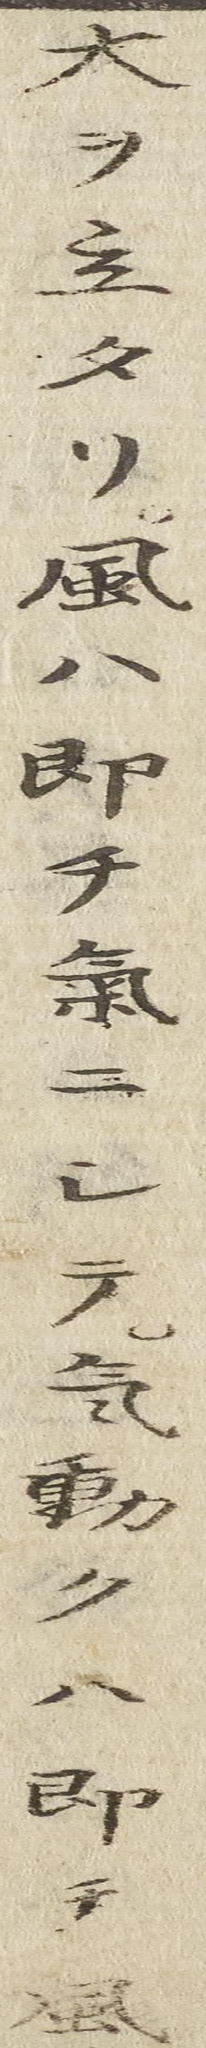大ヲ立タリ。風ハ即チ気ニシテ。気動クハ即チ風
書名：大略天学名目鈔　天經或問附録
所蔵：東京大学地震研究所図書室 Earthquake Research Institute Library, The University of Tokyo, JAPAN
